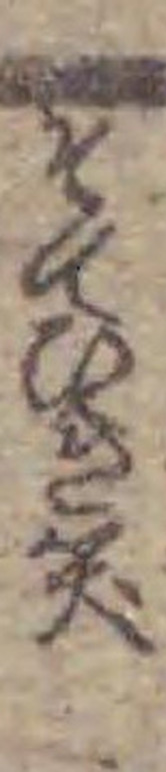そてひき笑
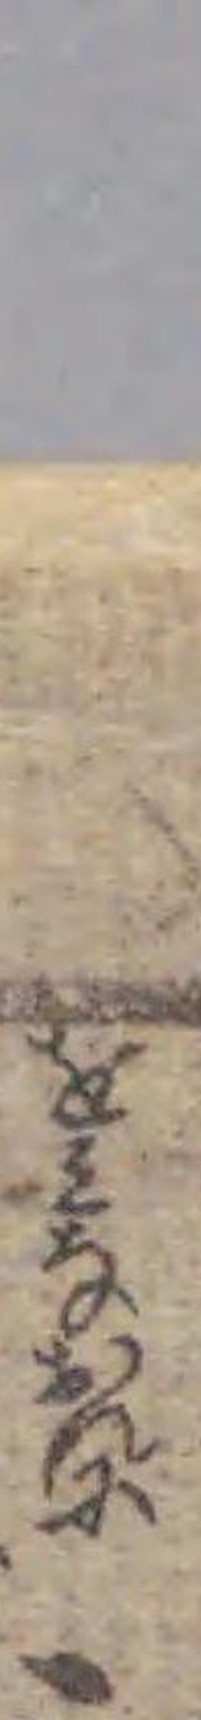をみなおれに
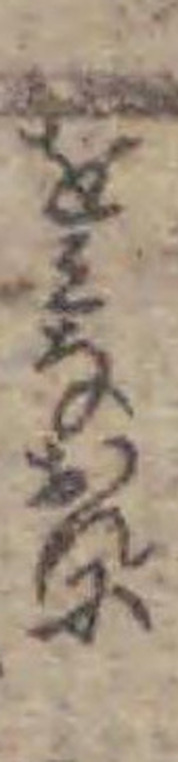をみなおれに
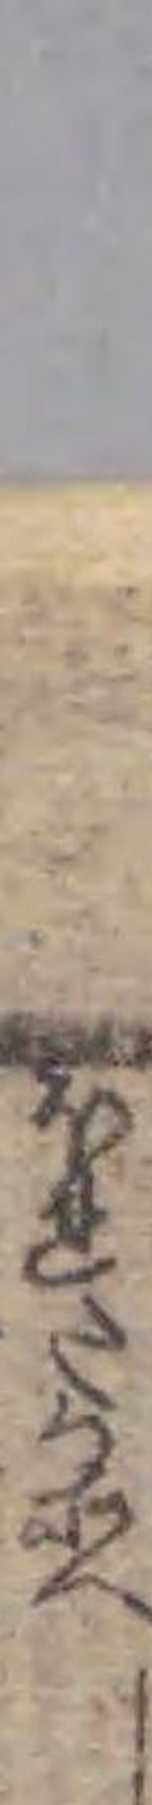ほれたか所へ
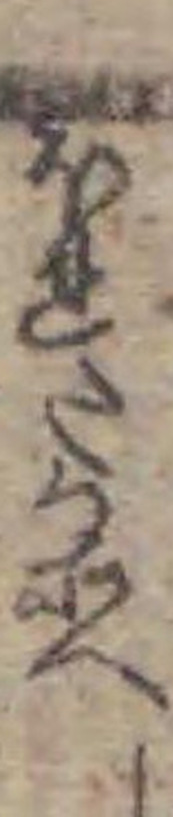ほれたか所へ
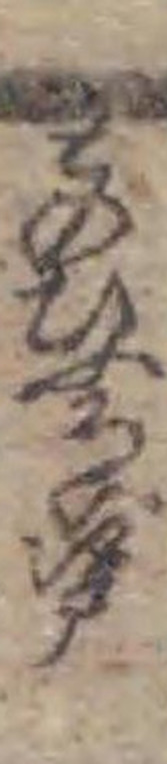このひふろい江戸
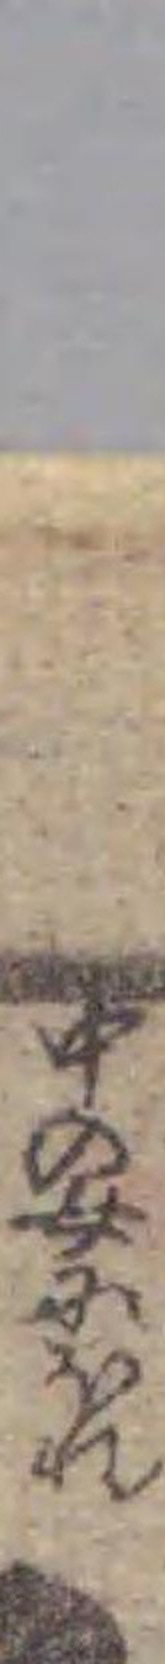中の女にほれ
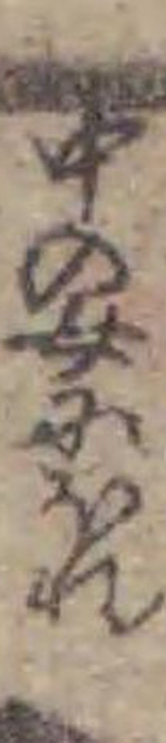中の女にほれ
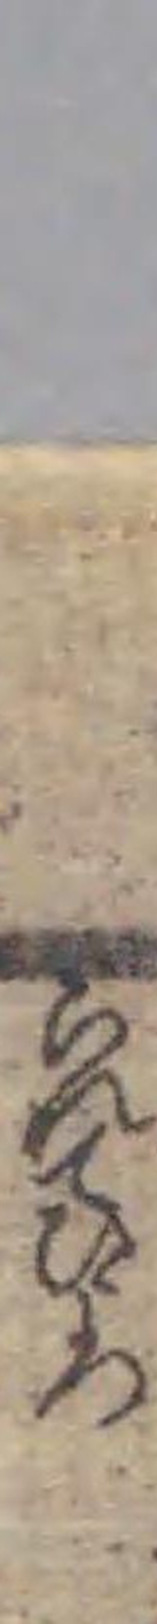られてひよつ
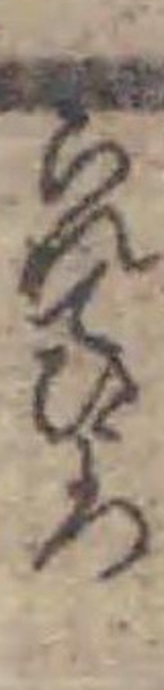られてひよつ
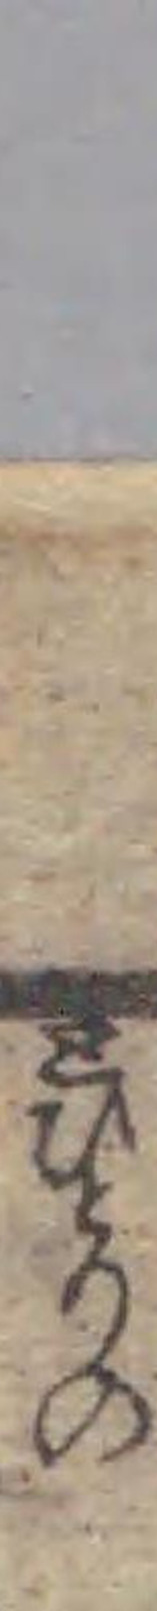とひとりの
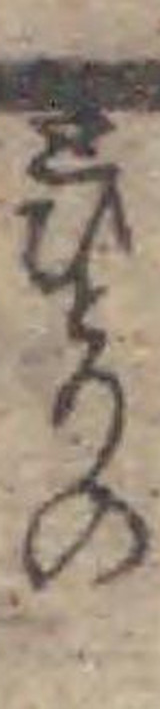とひとりの
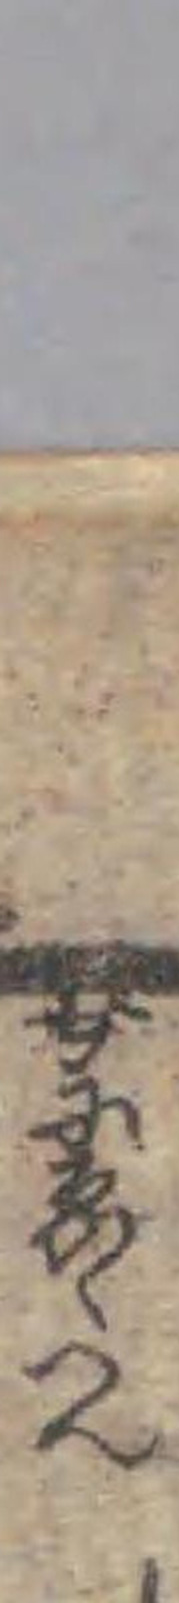女にゑゝへん
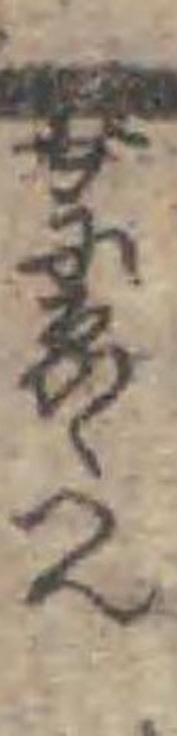女にゑゝへん
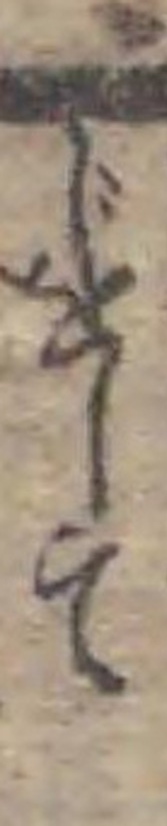じをして
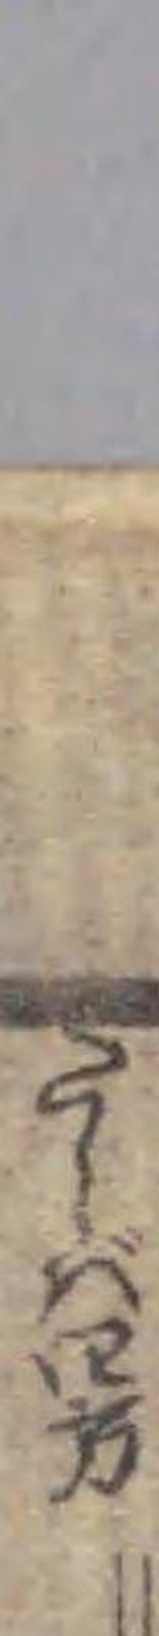たらば四方
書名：通風伊勢物語 : 3巻
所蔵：国立国会図書館 National Diet Library, JAPAN
